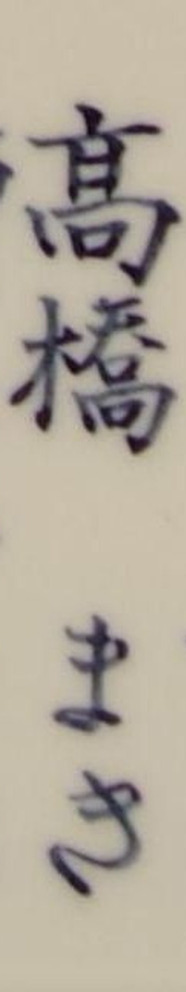高橋まき
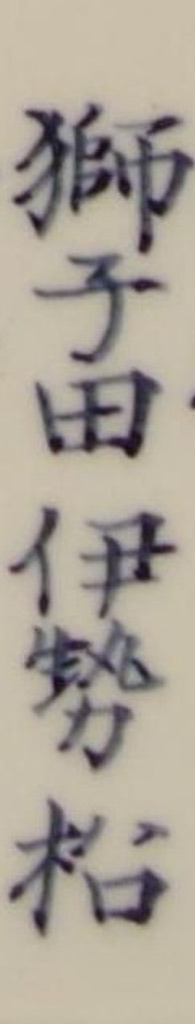獅子田伊勢松
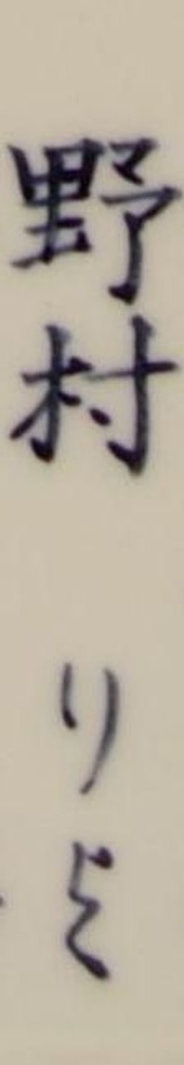野村りよ
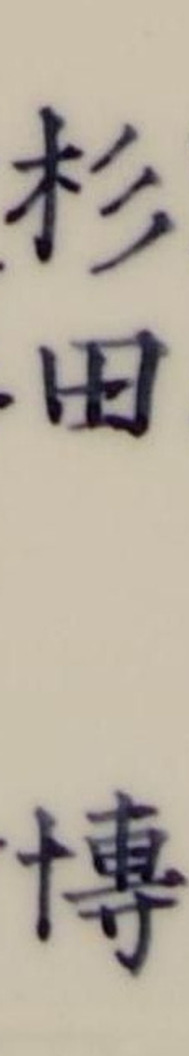杉田博
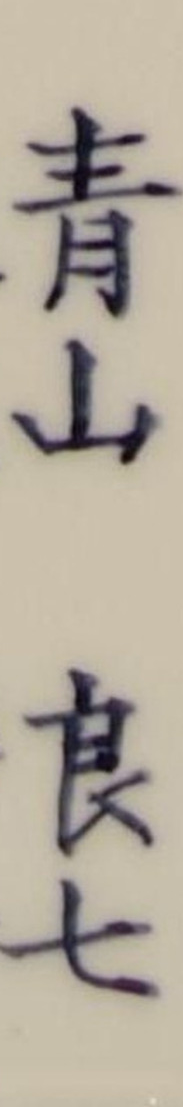青山良七
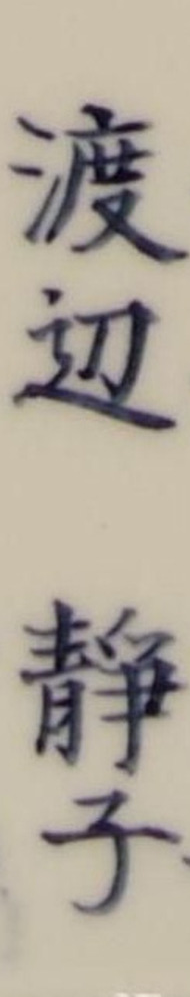渡辺静子
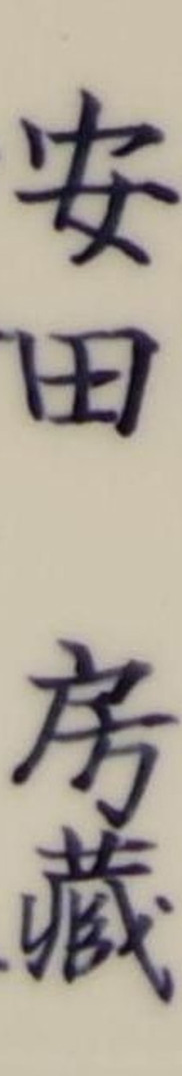安田房藏
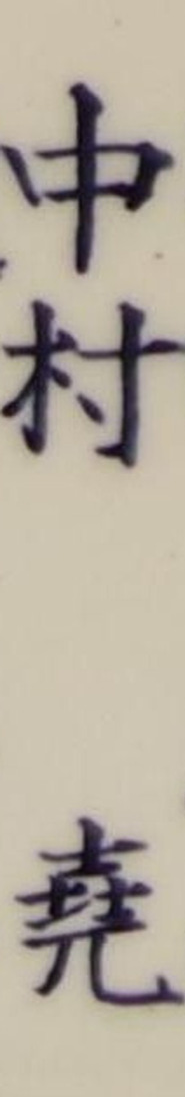中村尭
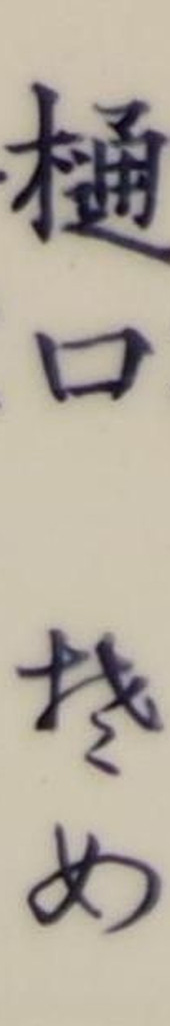樋口そめ

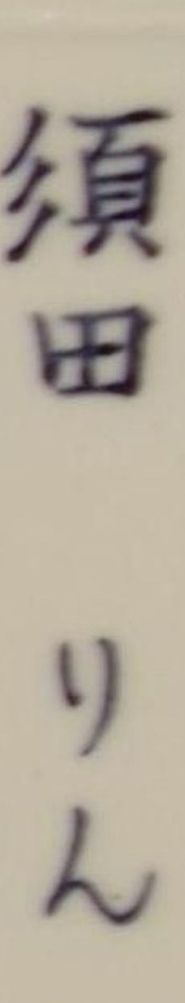須田りん
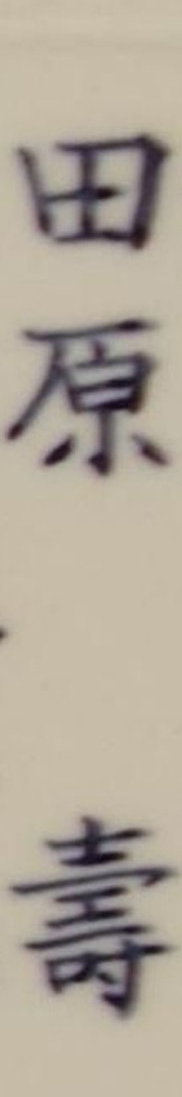田原寿
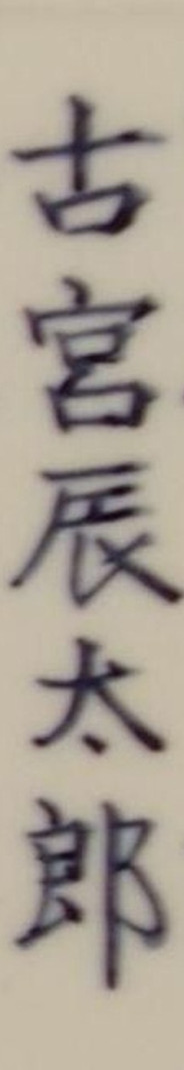古宮辰太郎
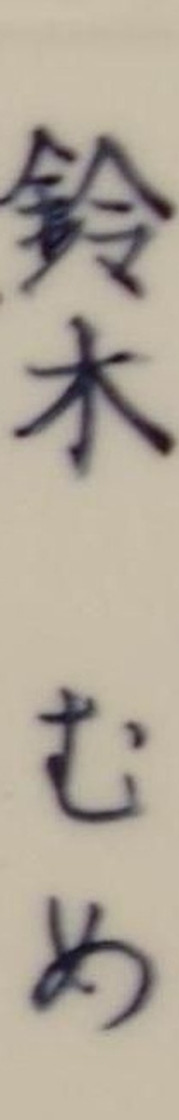鈴木むめ
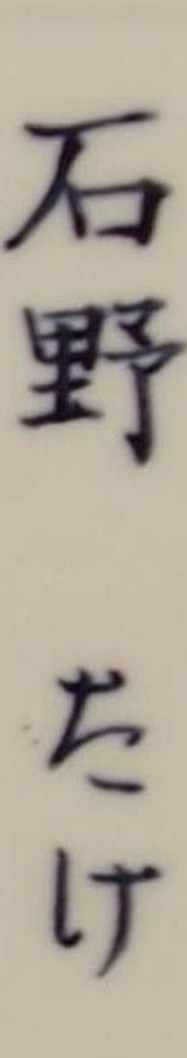石野たけ
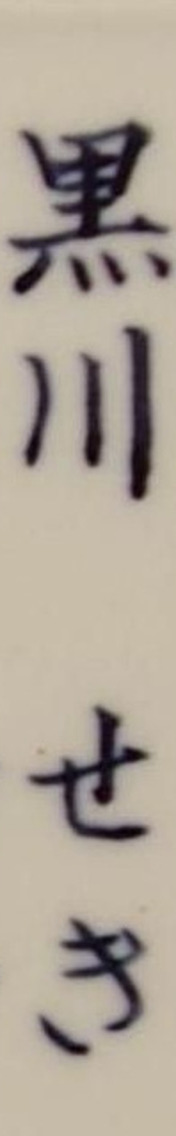黒川せき
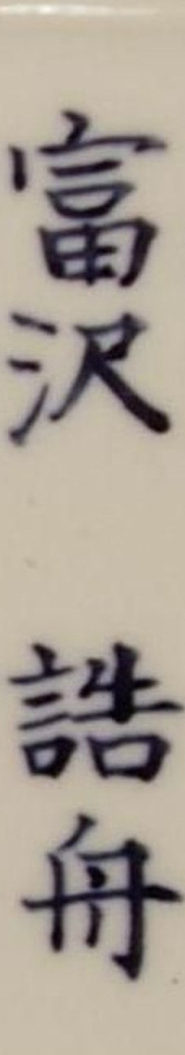富沢詰舟
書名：E~L
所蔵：高野山金剛峯寺
